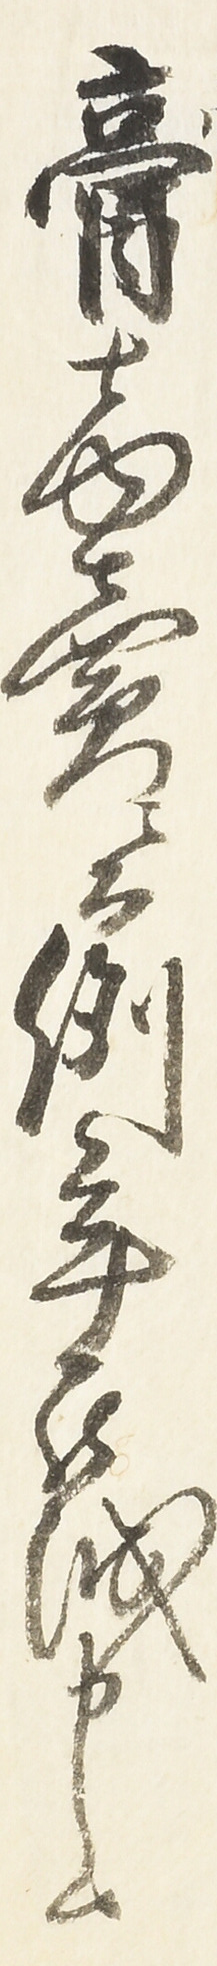膏商売ニ而例年罷越申候
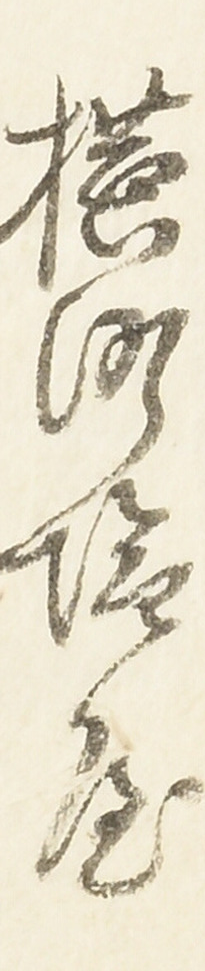横町塩屋
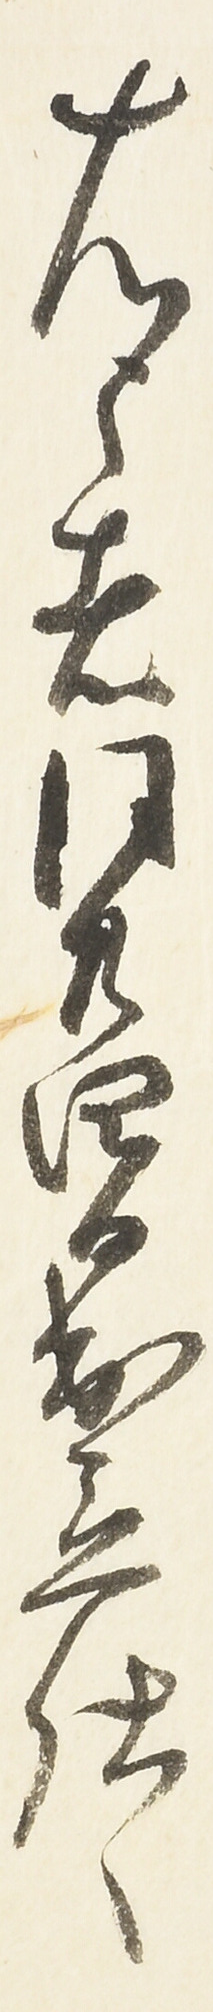右之者同廿四日出立仕候
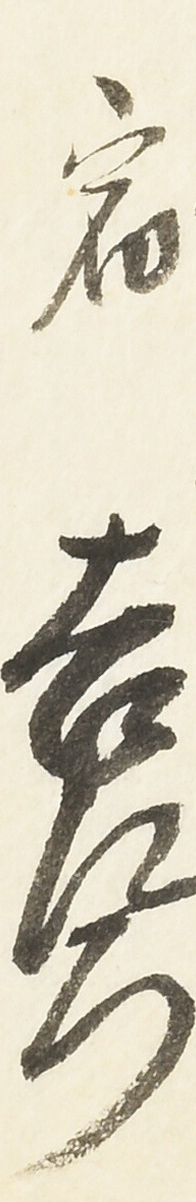宿吉左衛門
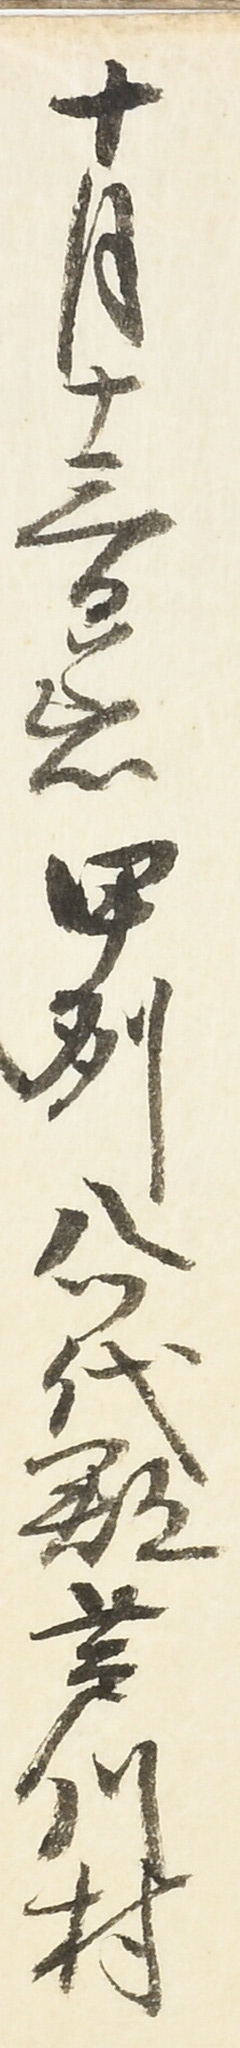十月十三日着甲州八ツ代郡芦川村
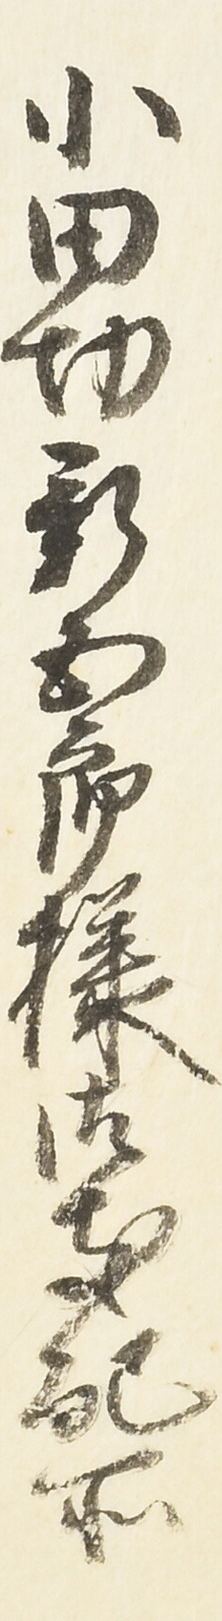小田切新五郎様御支配所
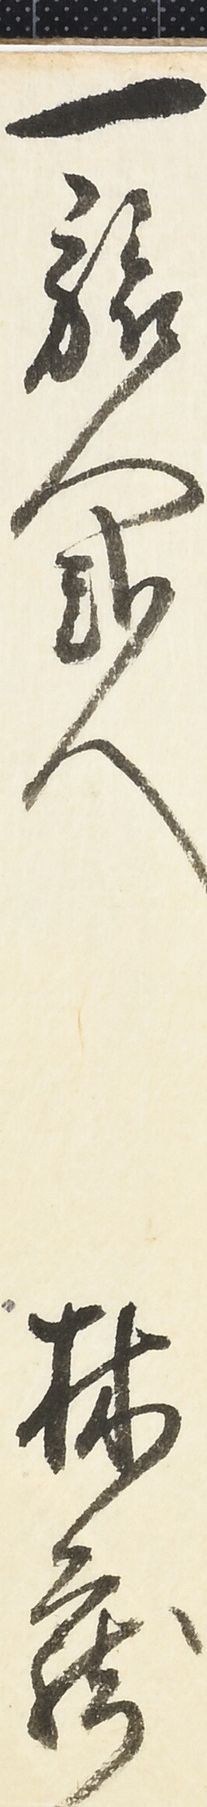一旅人弐人林蔵
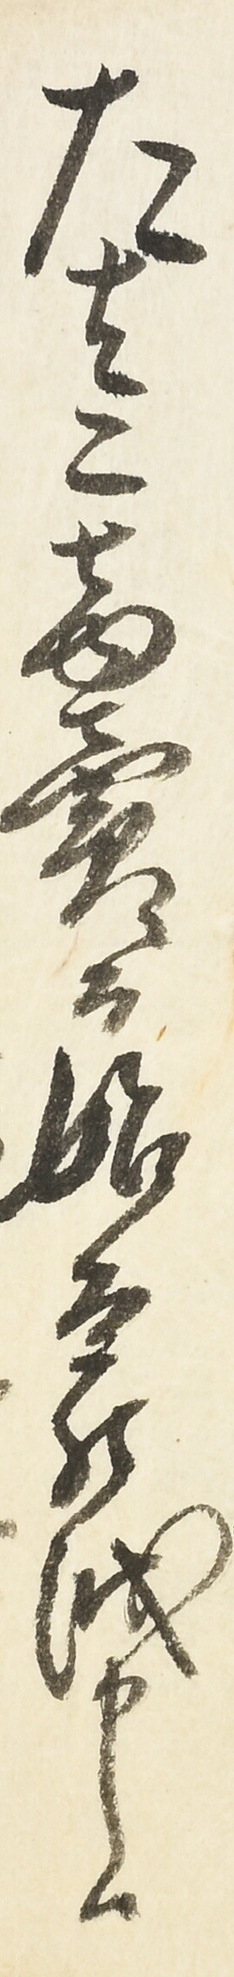たはこ商売ニ而始而罷越申候
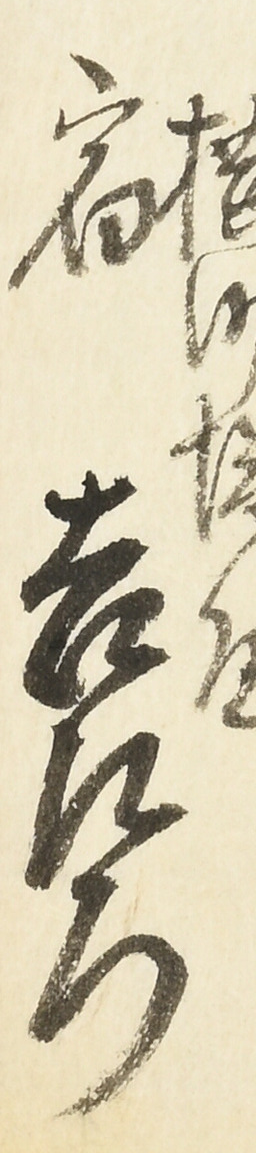宿吉左衛門

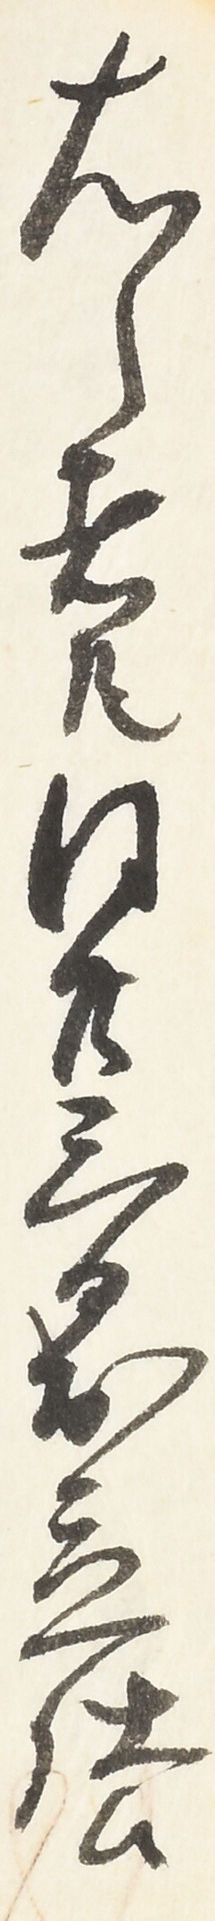右之者共同廿三日出立仕候
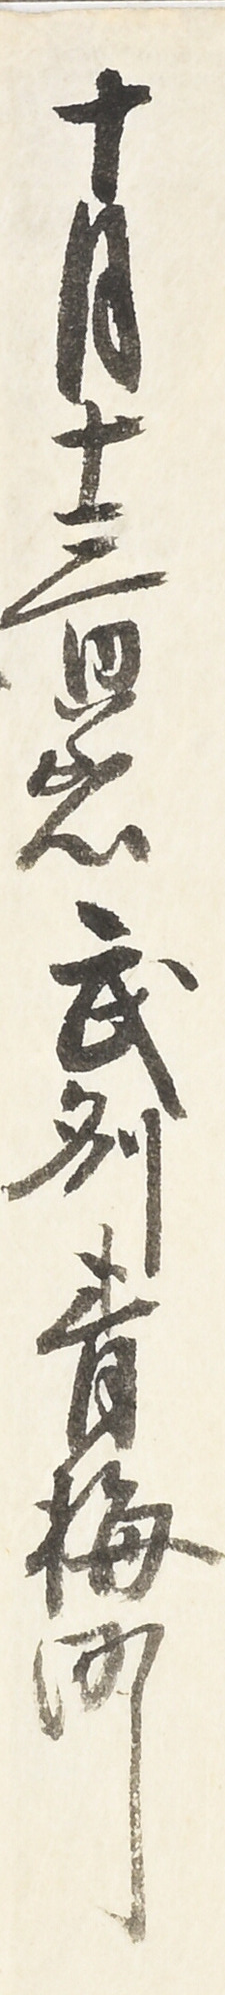十月十三日着武州青梅町
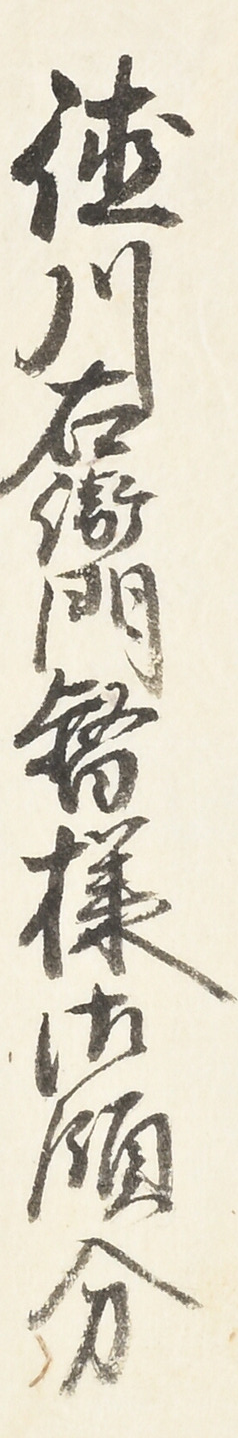徳川右衛門督様御領分
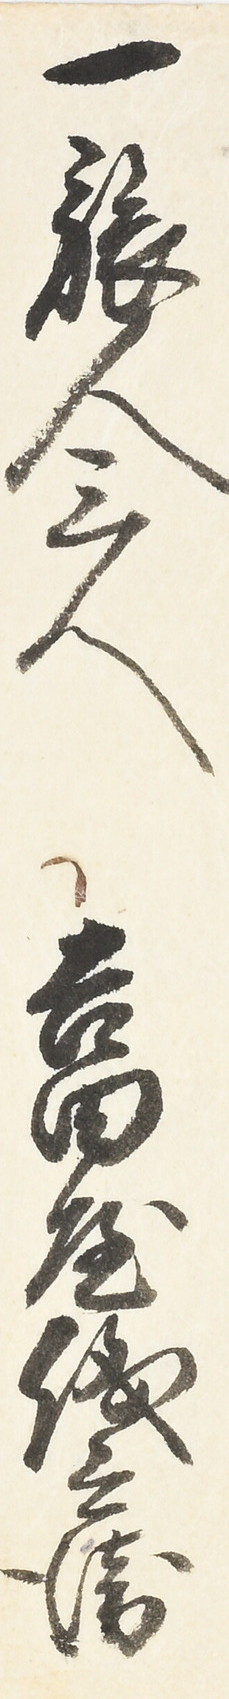一旅人三人吉田屋儀兵衛
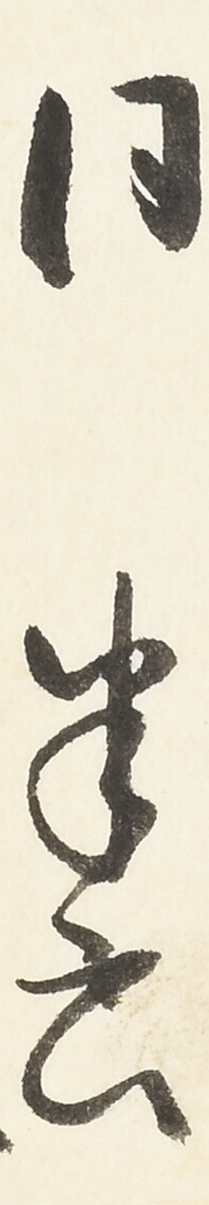同半六
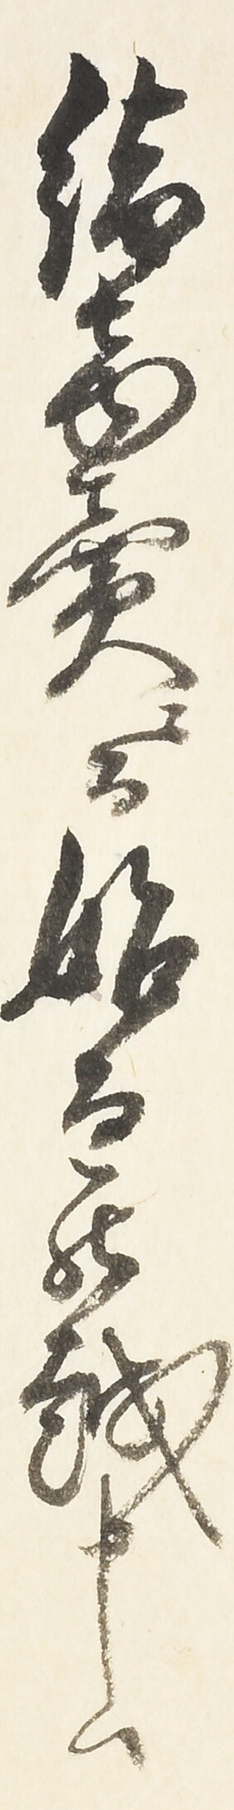絹商売ニ而始而罷越申候
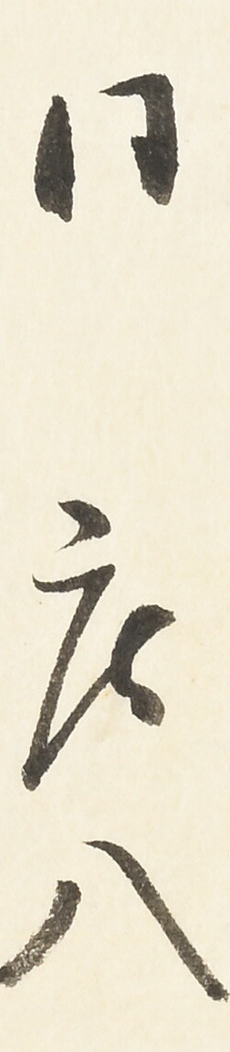同庄八
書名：町中旅人泊控帳
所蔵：伊那市立高遠町図書館・合同会社AMANE
